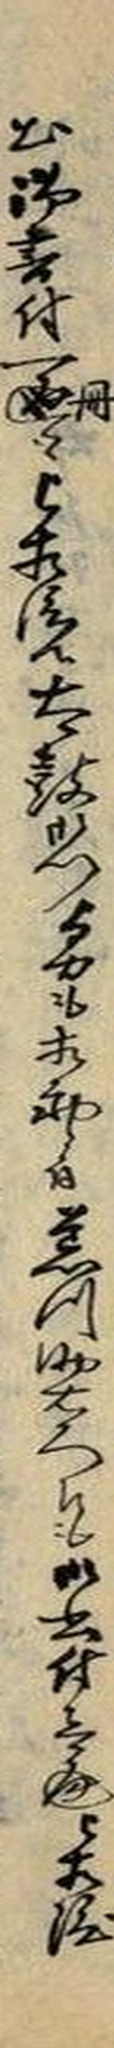出御書付一冊つゝ被相渡候太鼓御門与力も相勤候ニ付荒川助右衛門江も御書付壱通被相渡
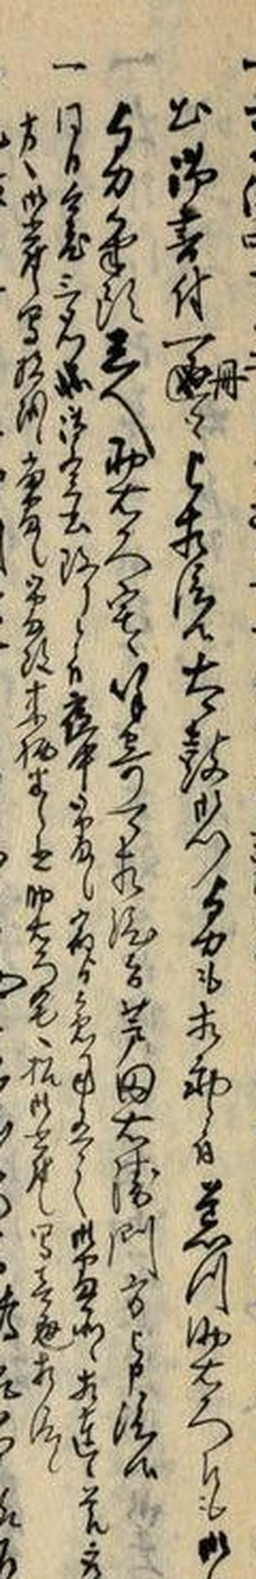与力筆頭壱人助右衛門宅へ呼寄可相渡旨芦田右衛門方被申渡候
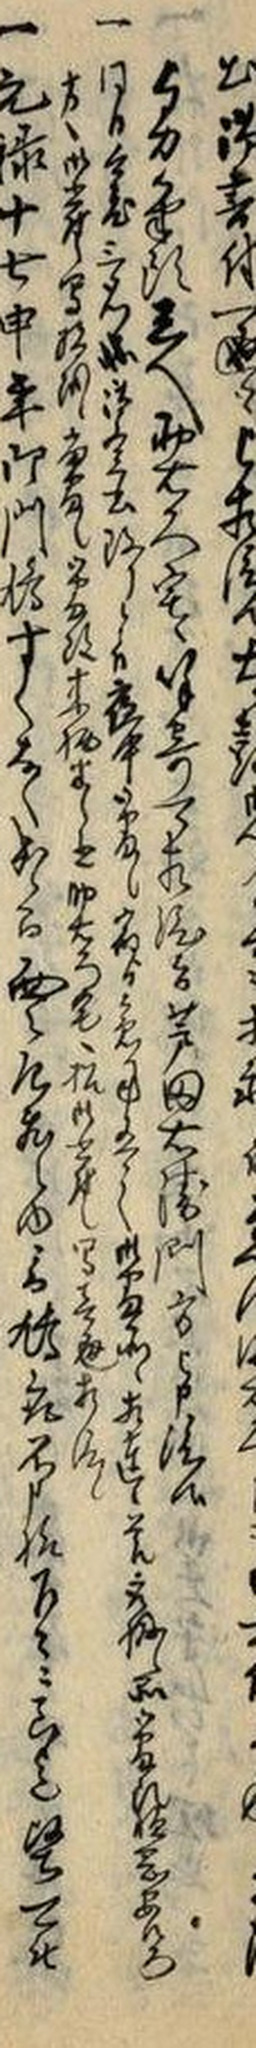一同日今度三御門所御定書改り候に付夜中御番候宿ゟ御急用有之御番所へ相達候節取扱候品御番頭恒岡安左衛門
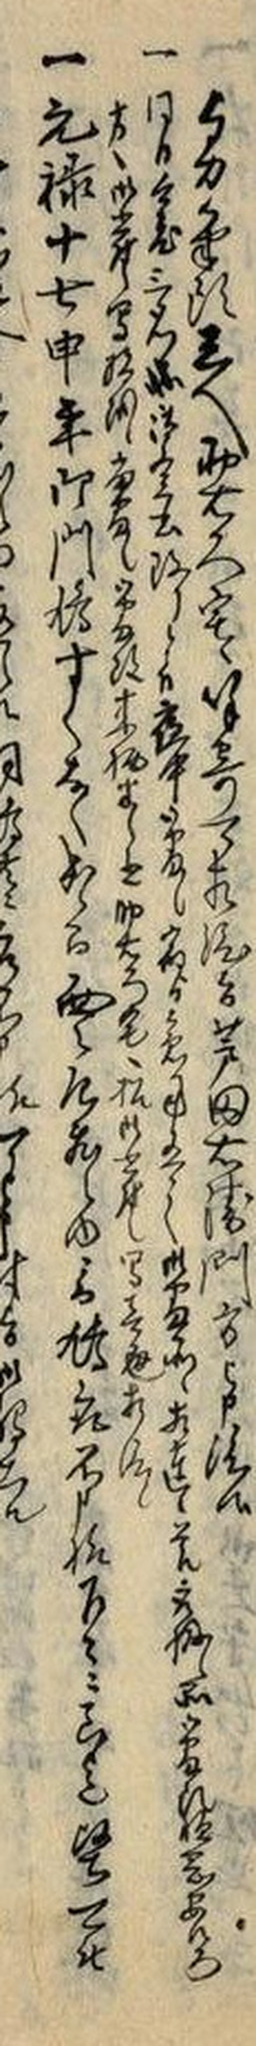方へ御書付写指渡候当番之御番改来栖半之丞助左衛門宅へ招御書付之写壱通相渡候
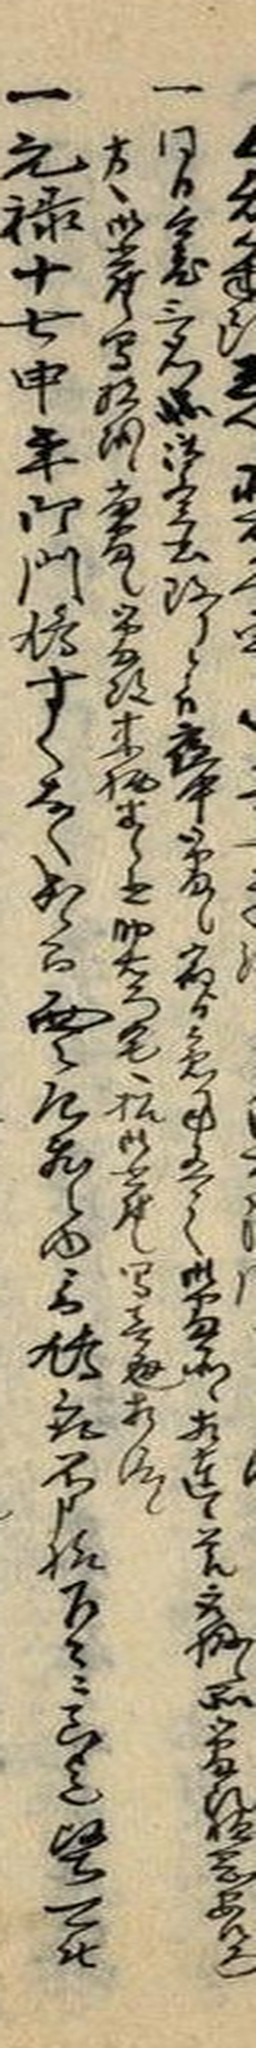一元禄十七申年御門鳩すくなく成候間面々屋敷之内に而鳩取不申様下々ニ至迄堅可被
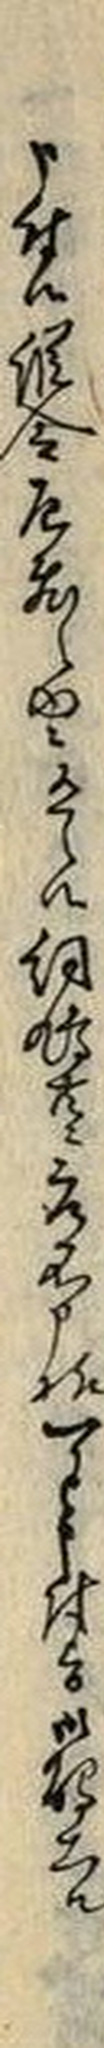申付候假令屋敷之内に有之候飼鳩共に取不申様可申付候旨御触出ル
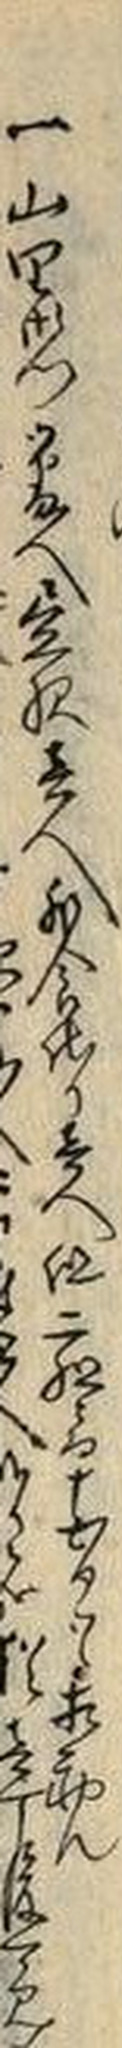一山里御門御番人昼夜壱人外食代り壱人但二組に而十五日つゝ相勤ル候
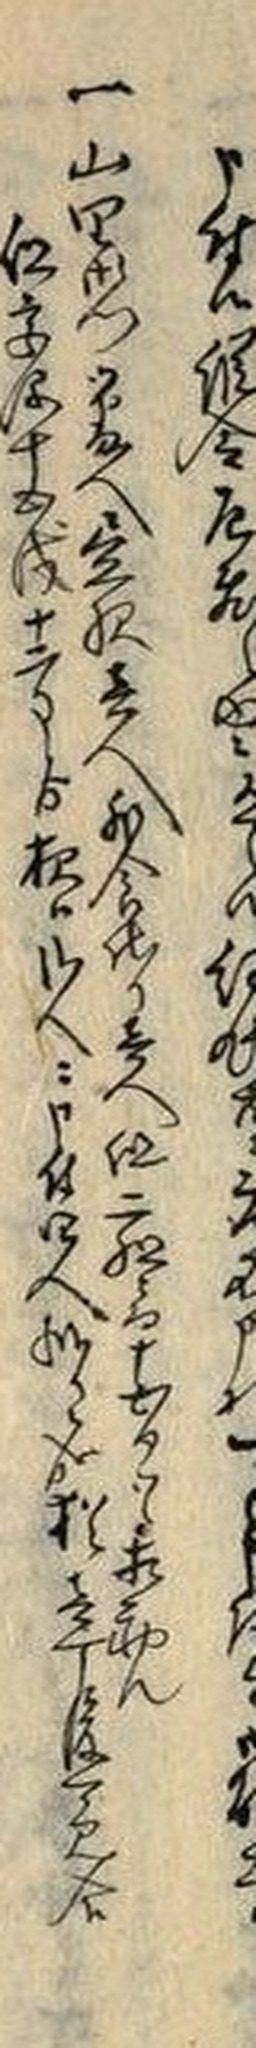但享保十五戌十二月ゟ夜は弐人に申付四人掛り被成猶壱丁後可見合
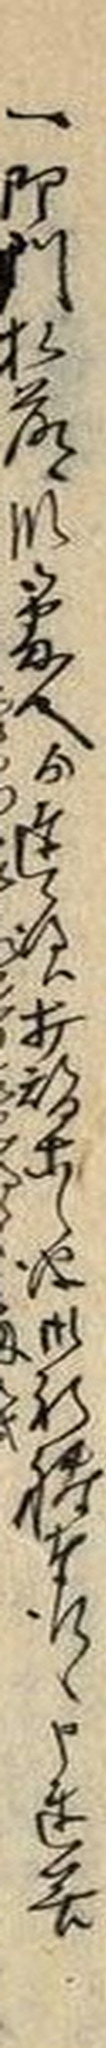一御門札落候段御番人ゟ達候へは打替等之儀御祈祷奉行へ達候筈
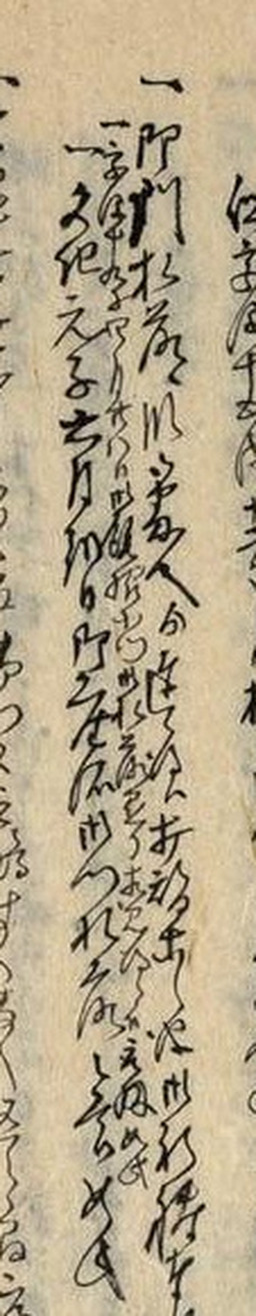一享保十九寅四月廿八日御厩脇小門御札落懸り相見得候に付取扱如此
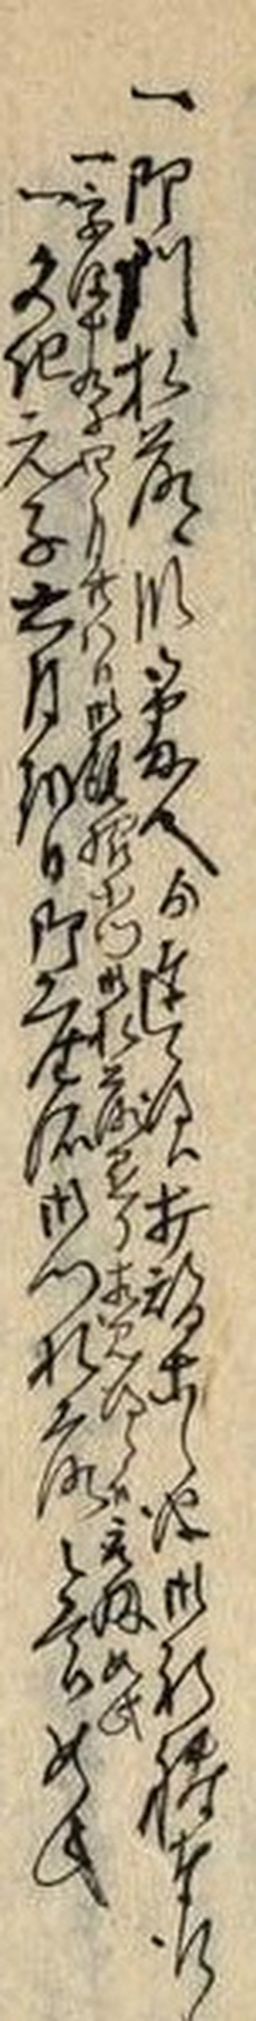一文化元子六月朔日御座所御門札落候節如此
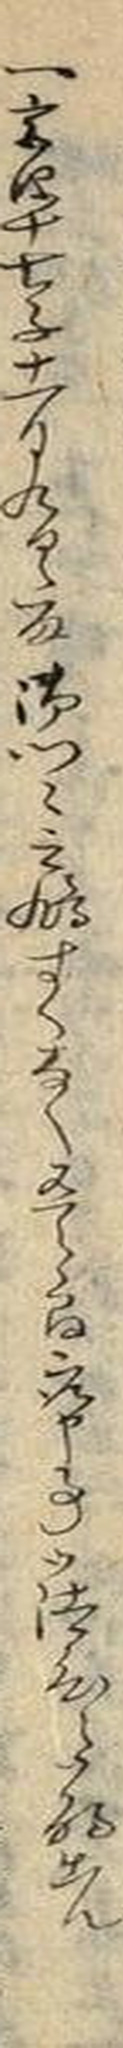一享保十七子十一月九日之留御門々之鳩すくなく有之候間取申事御法度之御触出ル
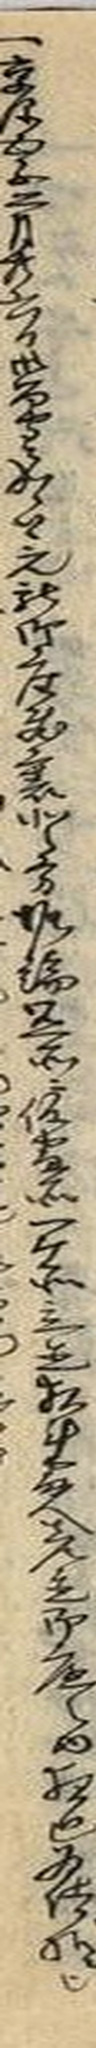一享保五子二月廿六日御留守被成候はゝ元新御座敷裏北之方堀端宜所に仮番所一ケ所立置夜斗番人差置御庭之内夜廻為仕候様被
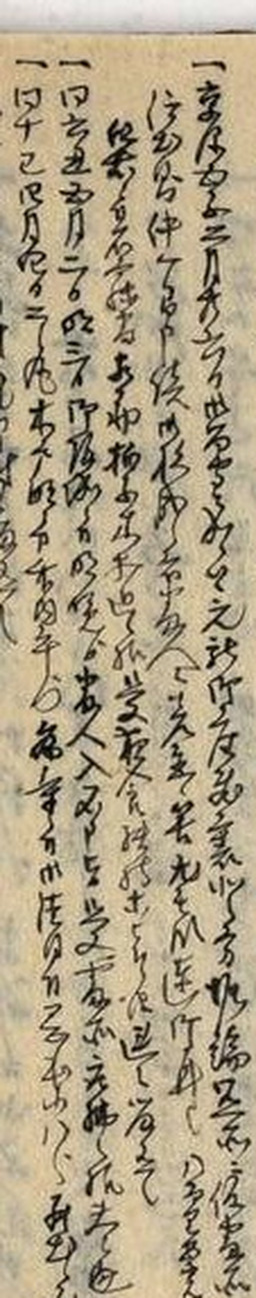但右に付不寝番相勤拍子木打廻候様且又夜食扶持等被下候儀連々留有之
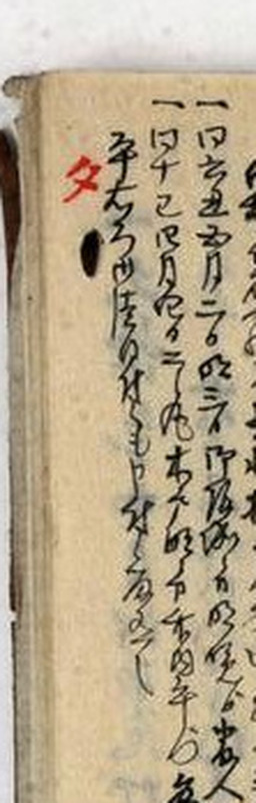平右衛門御徒目付へも申付候留有之

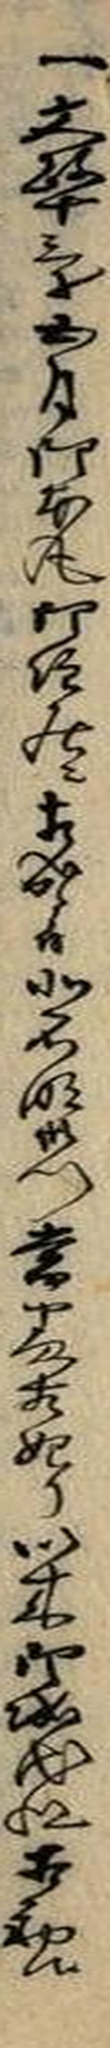一文政十三寅五月御本丸御住居に相成候二付北不明御門当番相始り以来御城代組相勤候
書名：御門御櫓之部
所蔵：福井県文書館 Fukui Prefectural Archives
